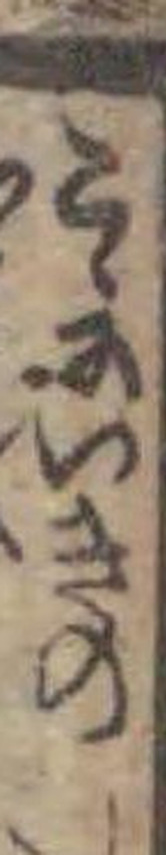こゝにいきの
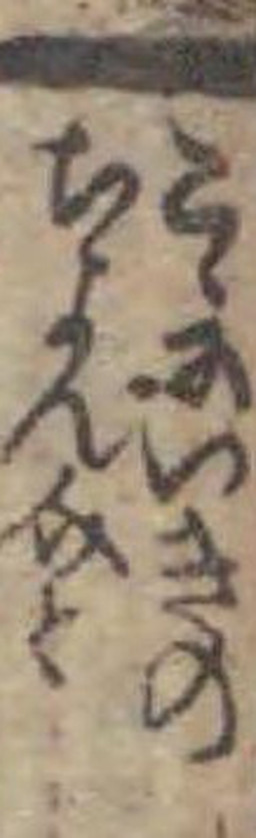ちよん介と
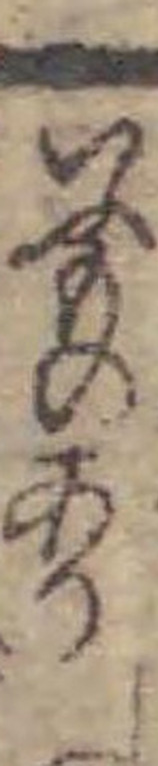いふものあり
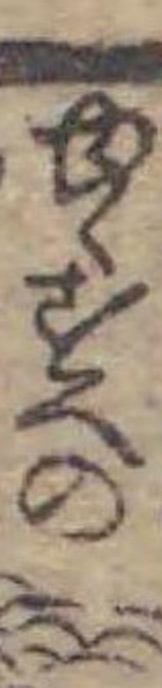ゆくすへの
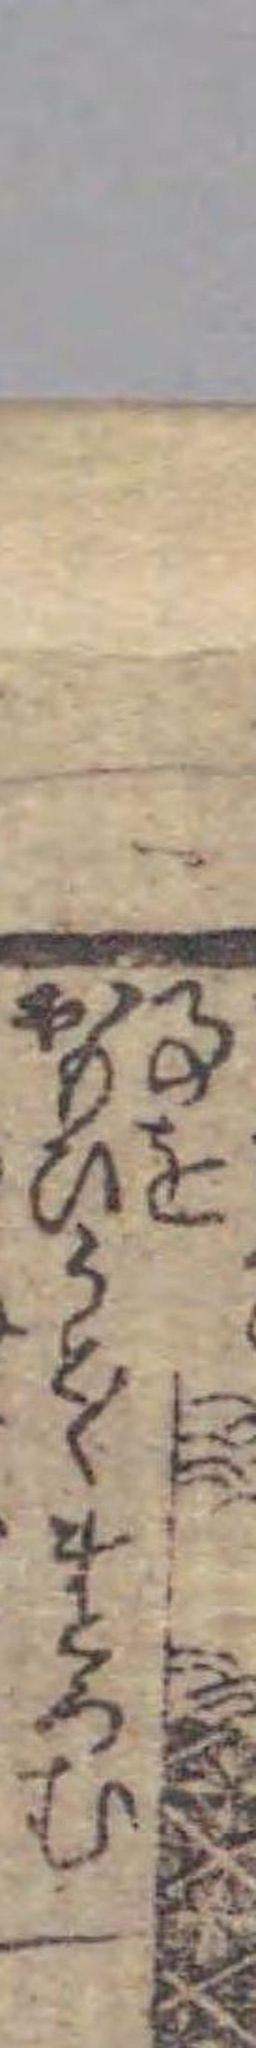おもひうと〳〵まとろむ
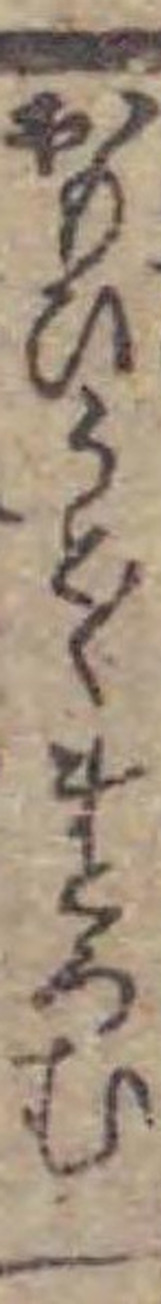おもひうと〳〵まとろむ
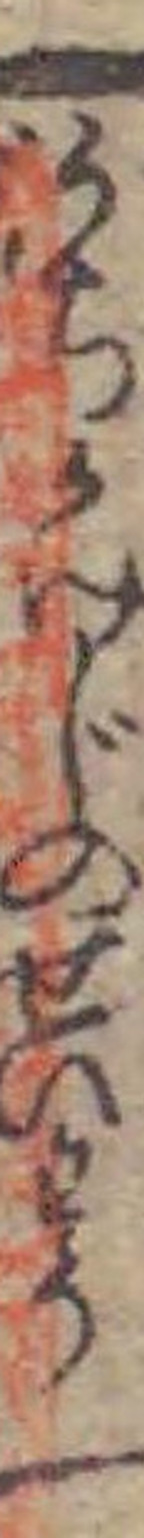うちかけじのせいわう
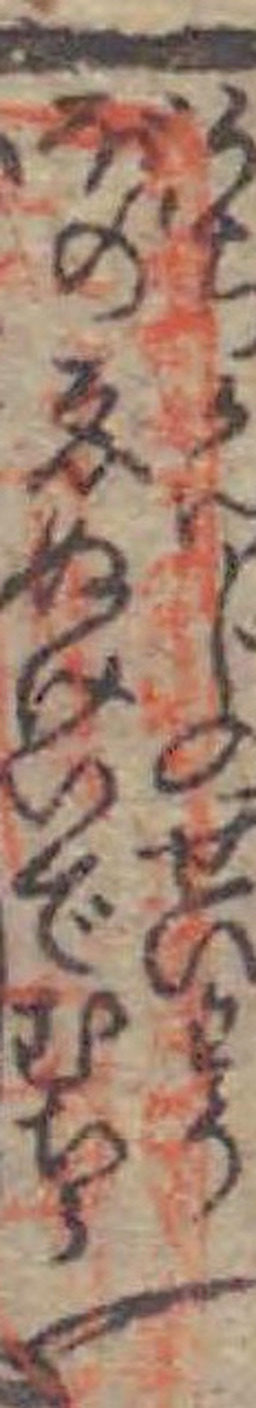ぼのゑぬけいでむちう
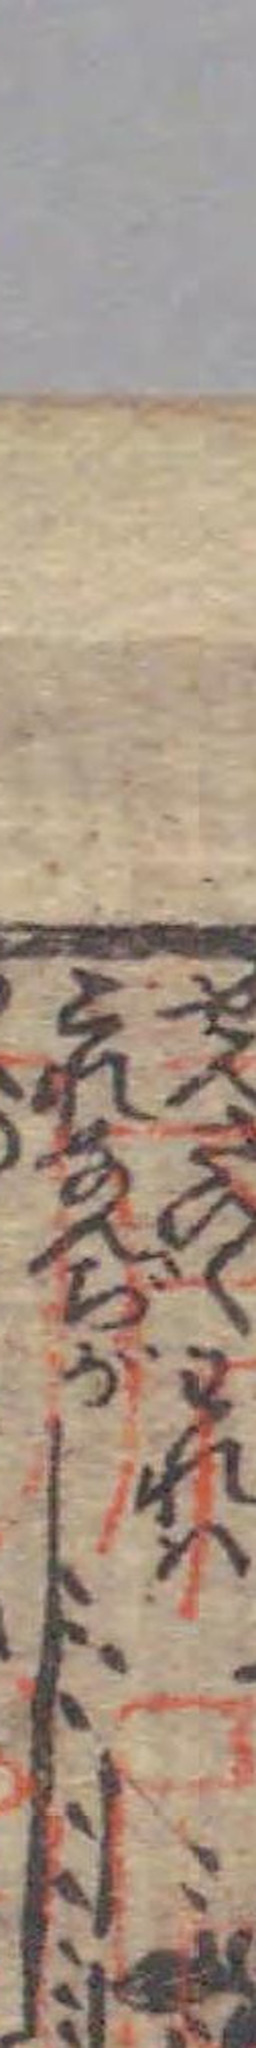これなんぢが
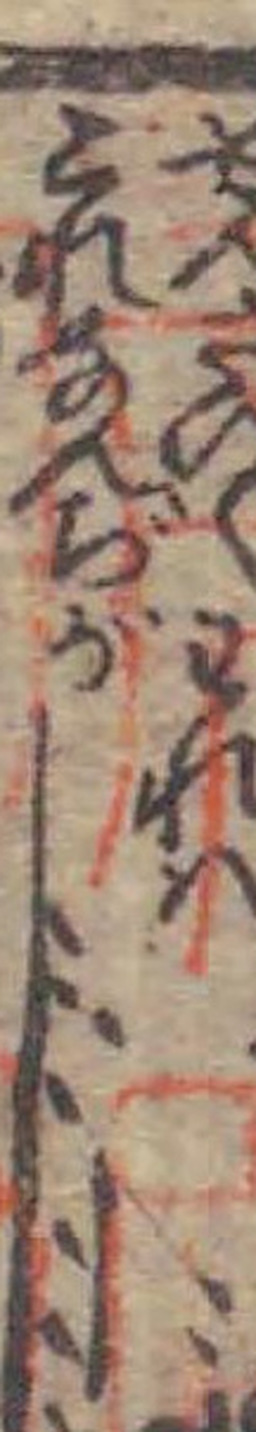これなんぢが
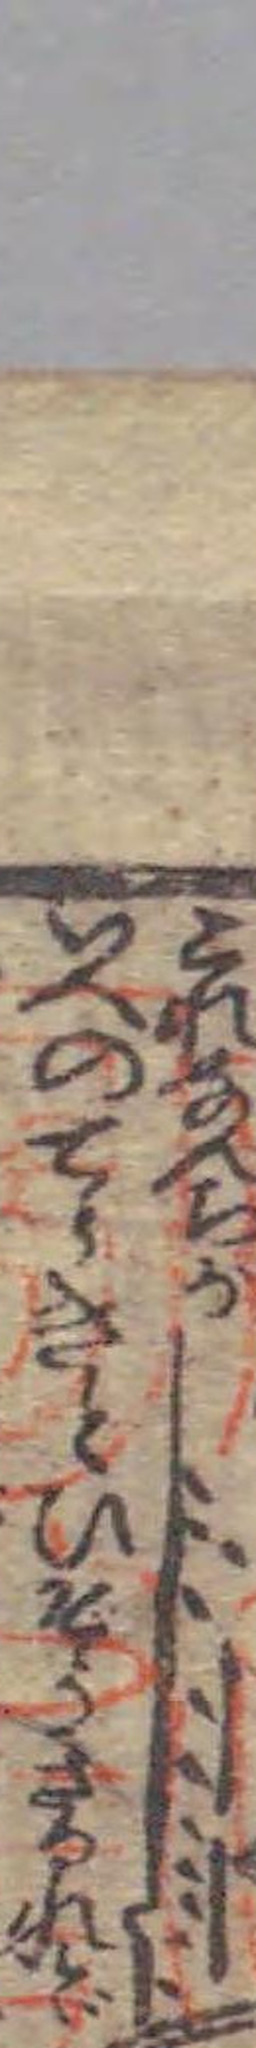いへのてうきとひそうさるれど
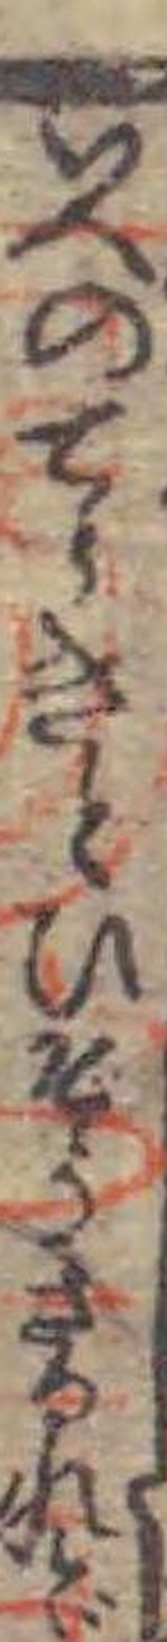いへのてうきとひそうさるれど
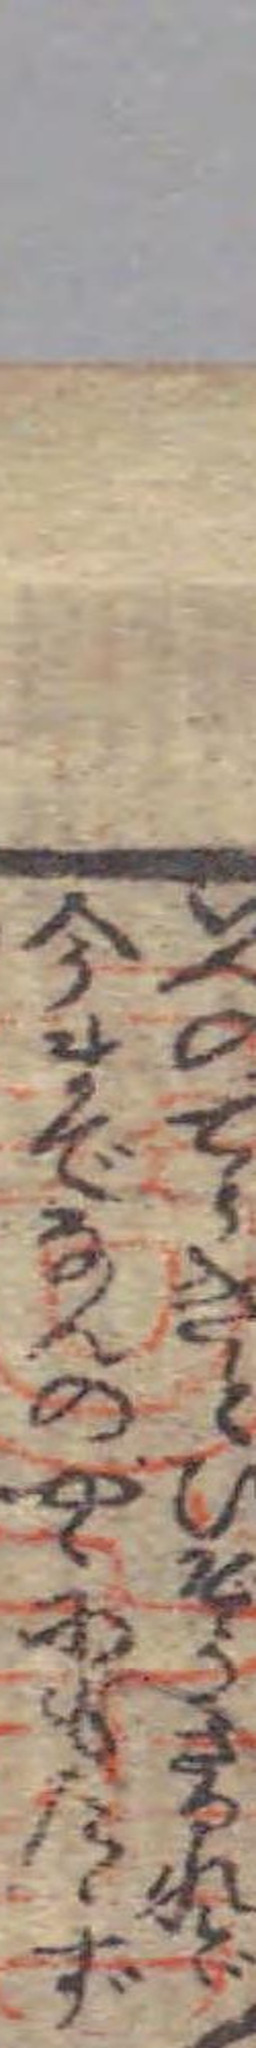今までなんのやくにもたゝず
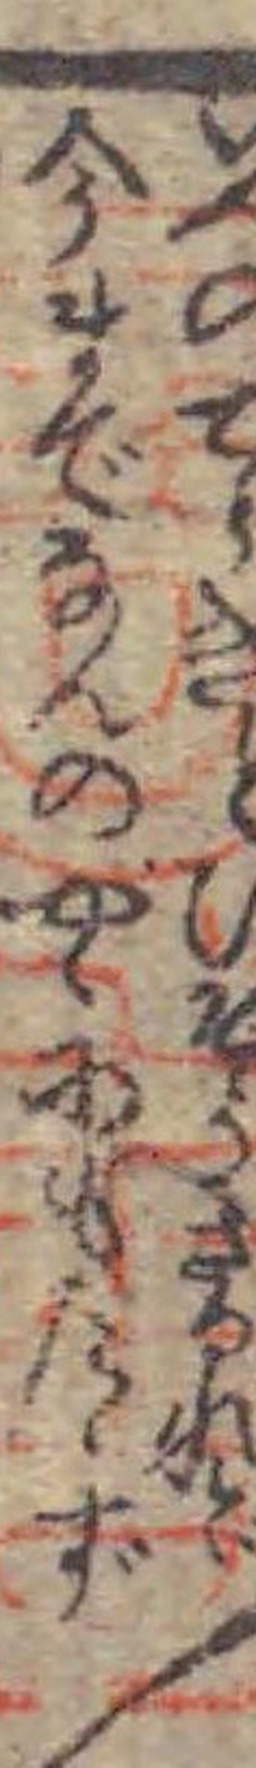今までなんのやくにもたゝず
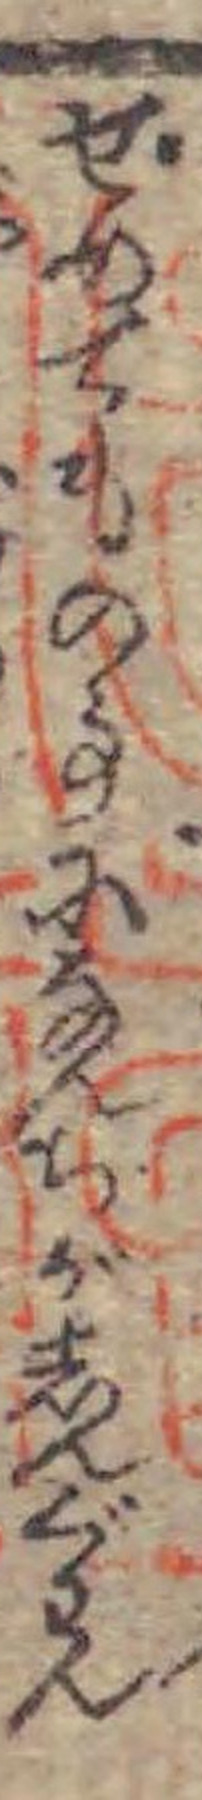せめてもの事になんぢがしんぐわん
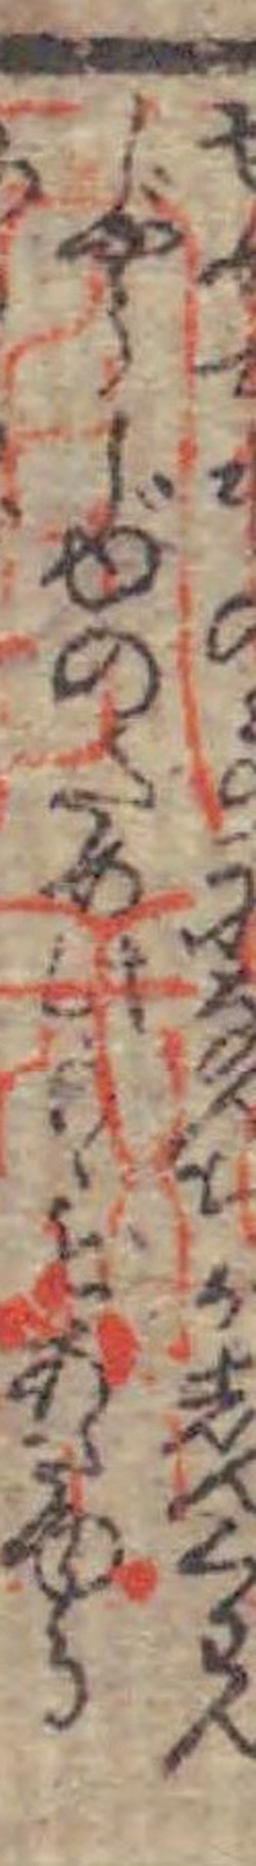じやうじゆのため此もゝをあたゆる
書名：威気千代牟物語 : 2巻
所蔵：国立国会図書館 National Diet Library, JAPAN
